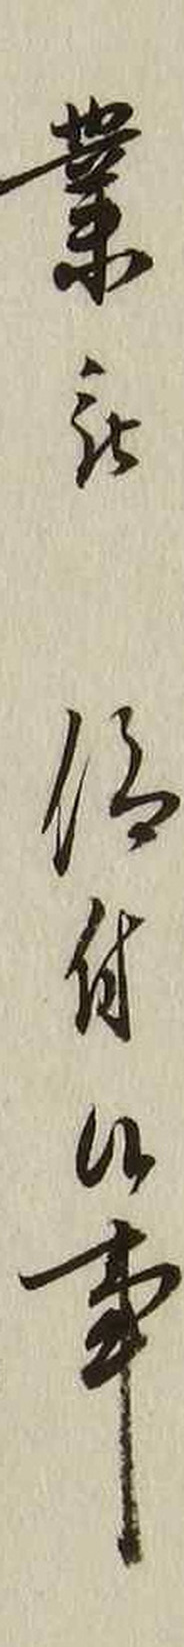業被仰付候事
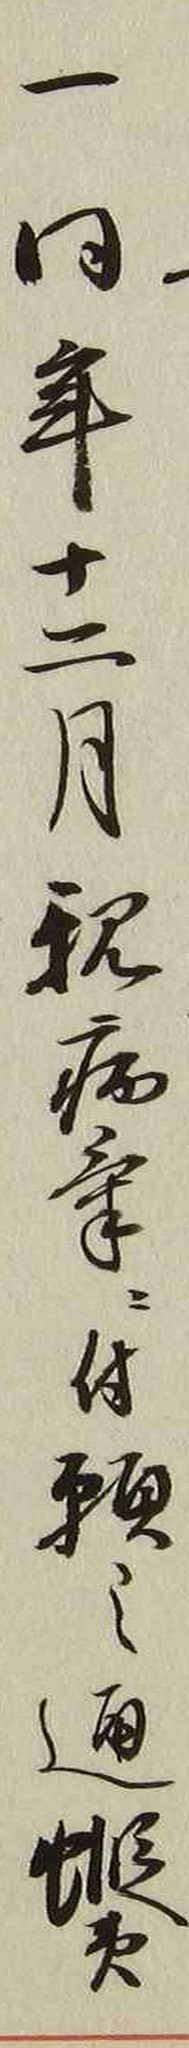一同年十二月親病気ニ付願之通蝦夷
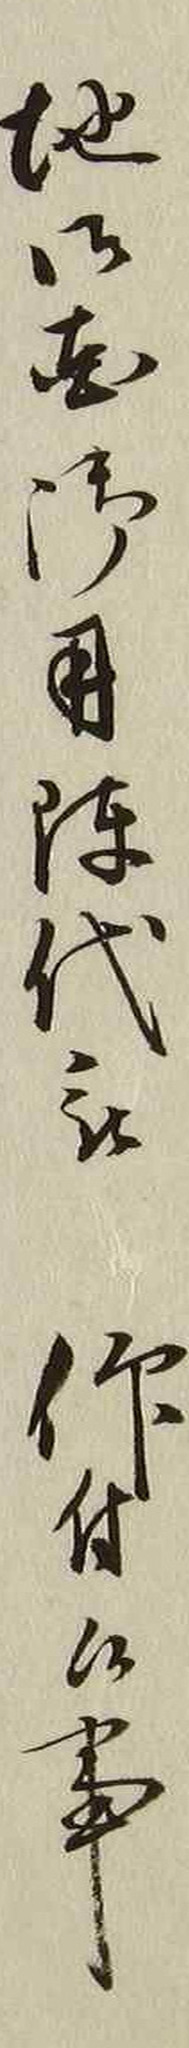地御固御用陣代被仰付候事
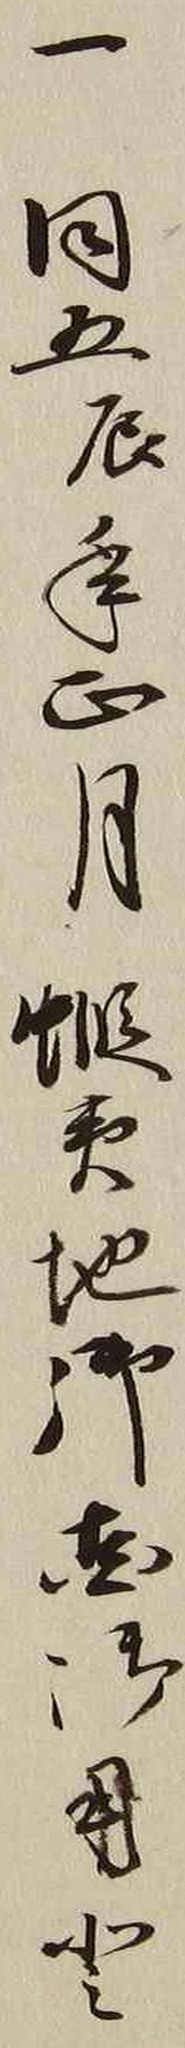一同五辰年正月蝦夷地御固御用と
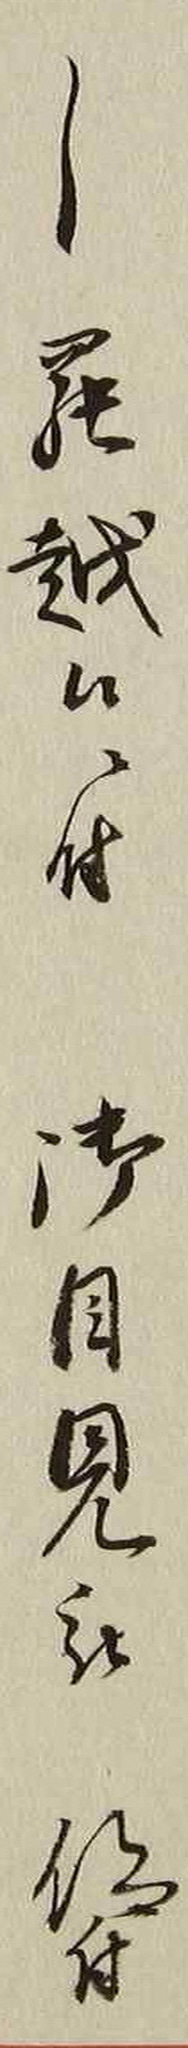し罷越候ニ付御目見被仰付
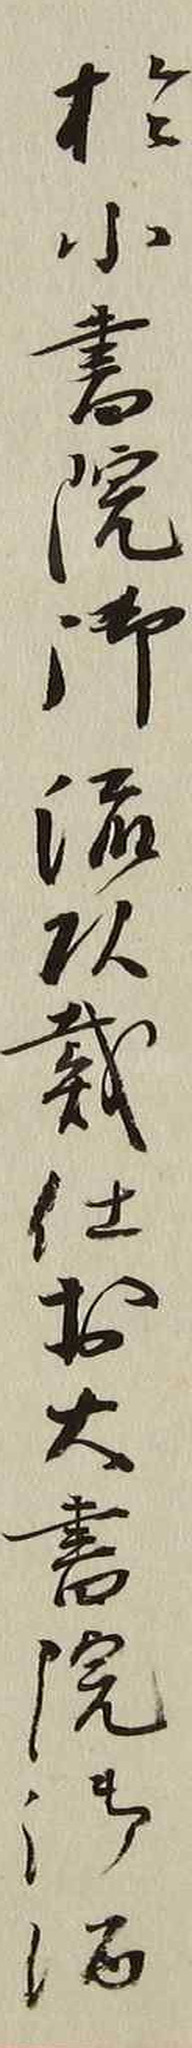於小書院御流頂戴仕於大書院御酒
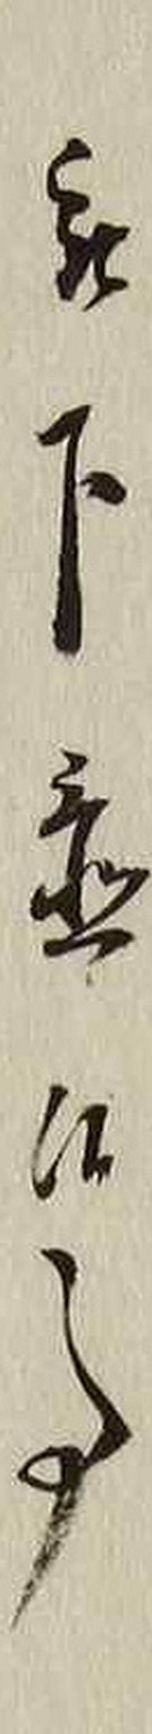被下置候事
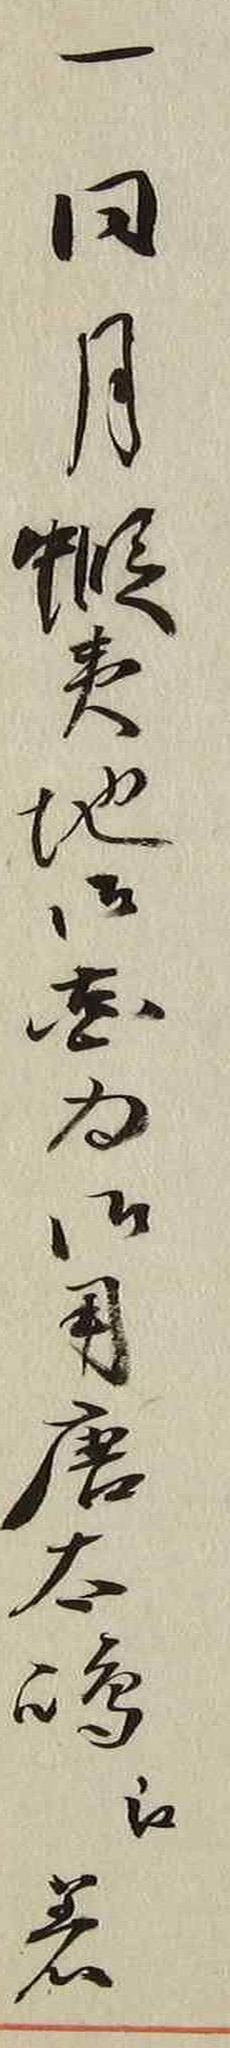一同月蝦夷地御固為御用唐太嶋江着
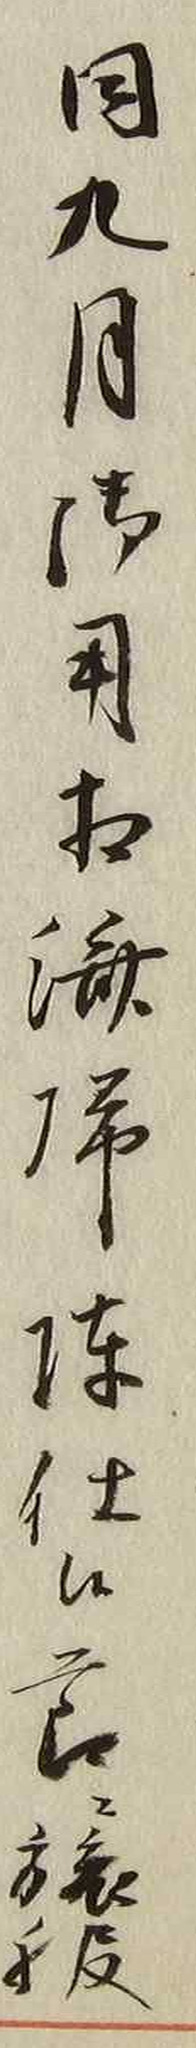同九月御用相済帰陣仕候節ニ旅服
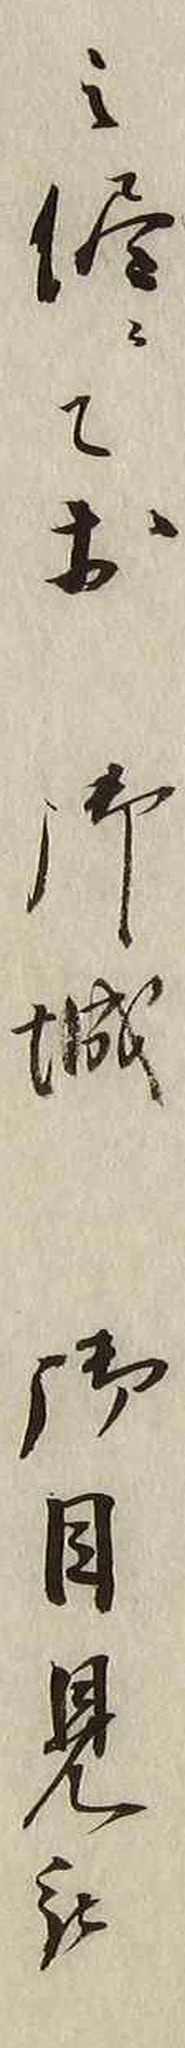之侭ニて於御城御目見被
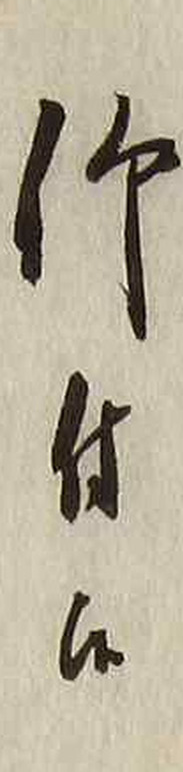仰付候
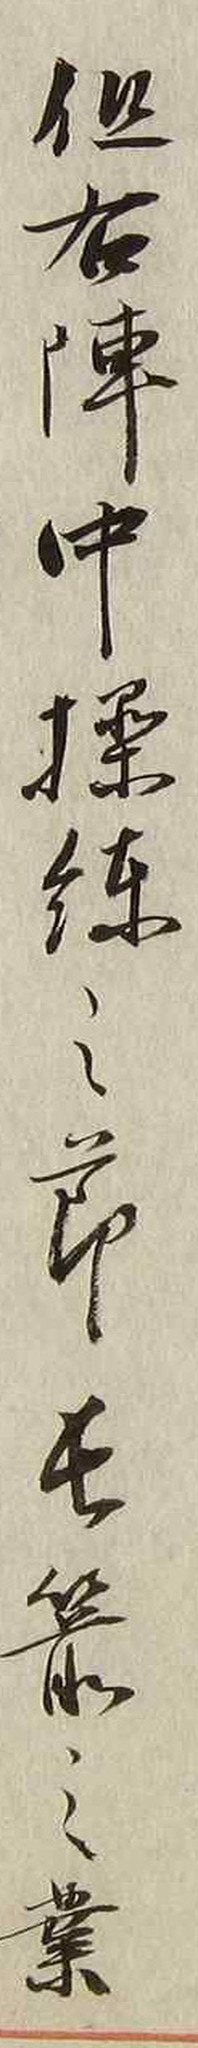但右陣中操練之節長箭之業
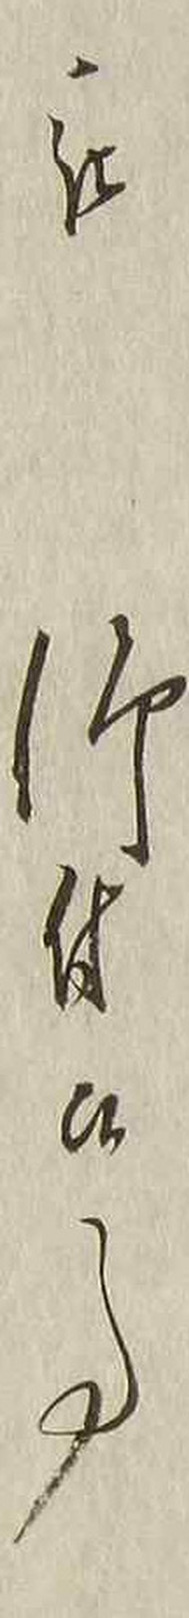被仰付候事
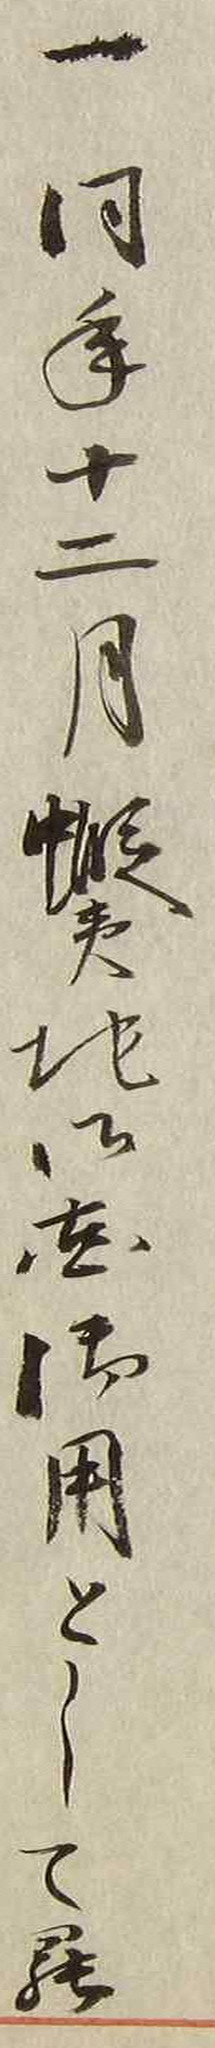一同年十二月蝦夷地御固御用として罷
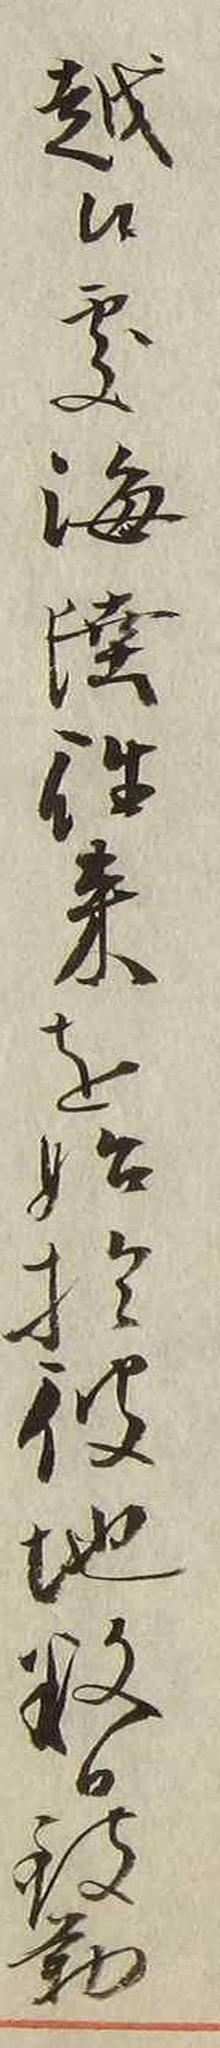越候処海陸往来を始於彼地数日致勤

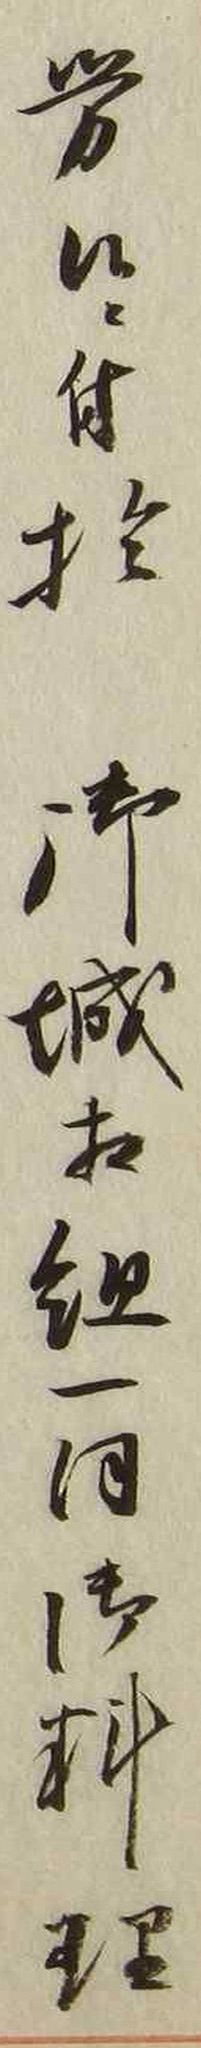労候ニ付於御城相組一同御料理
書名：諸士系譜　巻之22　い之部22
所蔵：会津若松市立会津図書館
